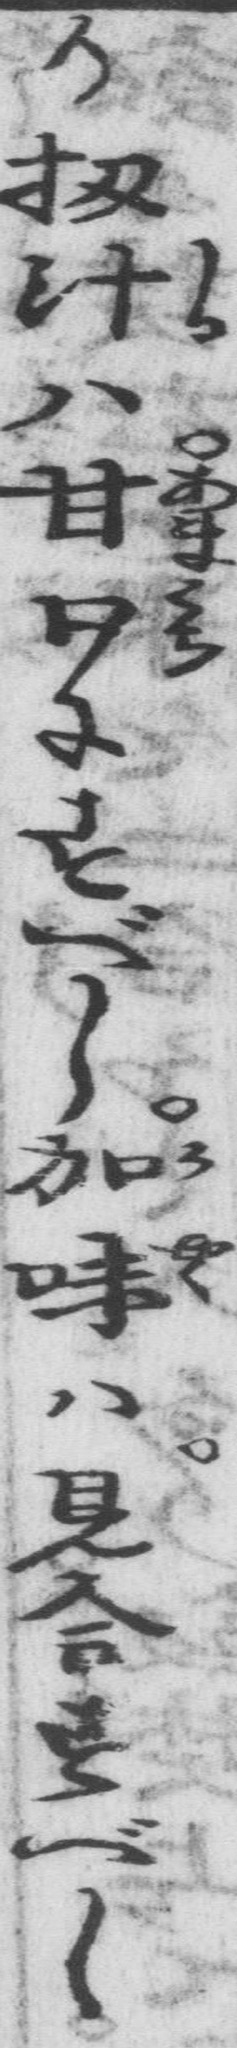り扨汁は。甘口にすべし。加味は。見合すべし
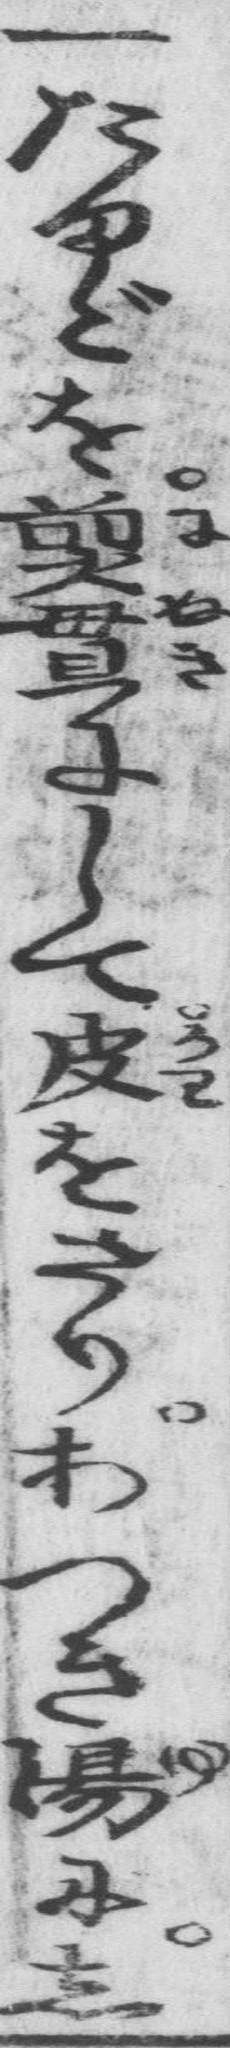一たまごを。煎貫にして。皮をさり。あつき湯に。し
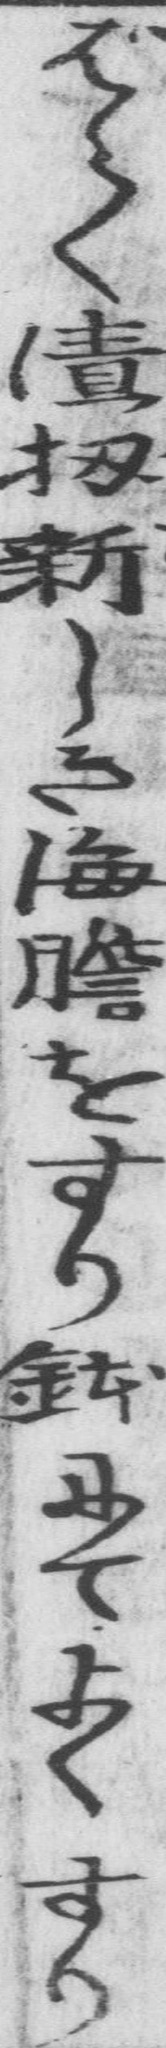ばらく漬。扨新しき海胆をすり鉢にて。よくすり
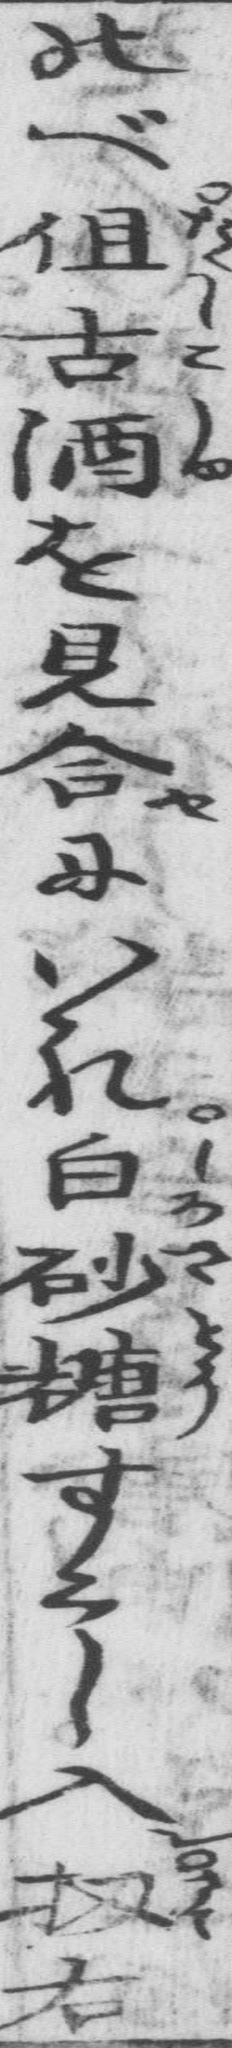のべ。但古酒を見合せにいれ。白砂糖すこし入れ。扨右
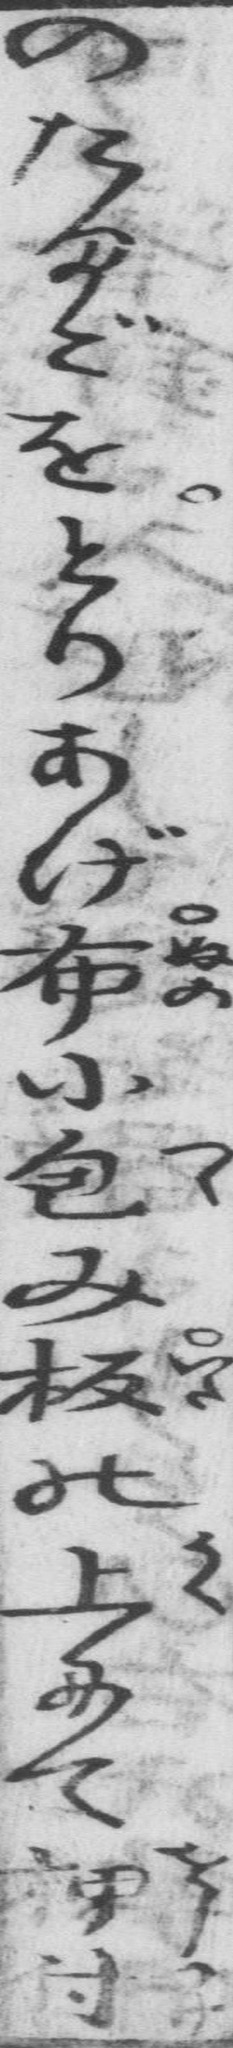のたまごを。とりあげ。布に包み。板の上にて押付
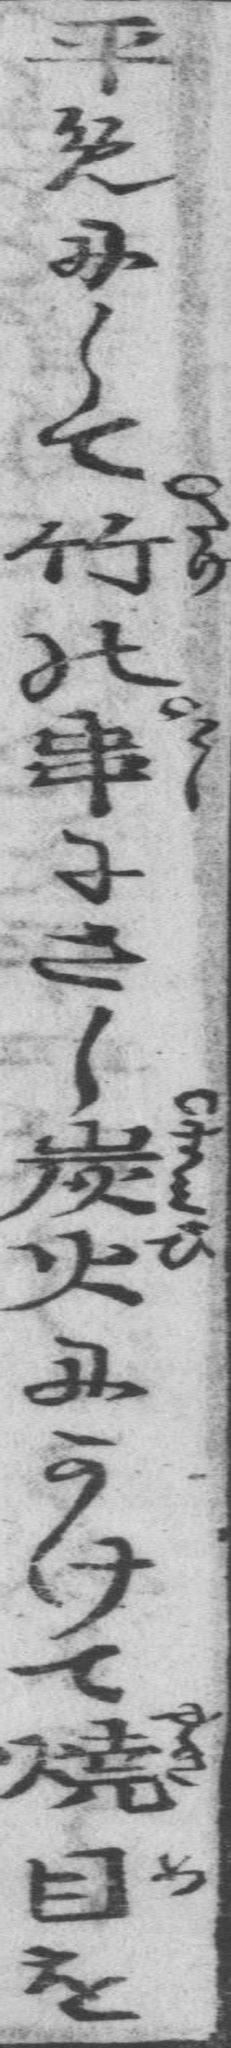平めにして。竹の。串にさし。炭火にかけて焼目を
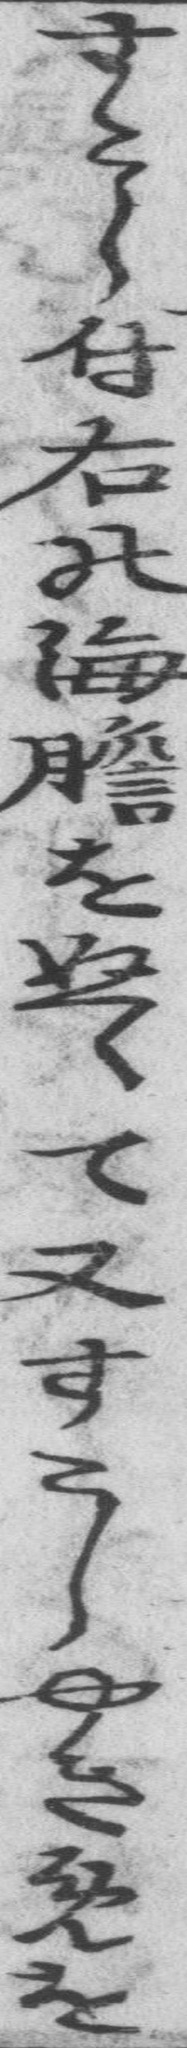すこし付。右の海胆をぬりて又すこしやきめを
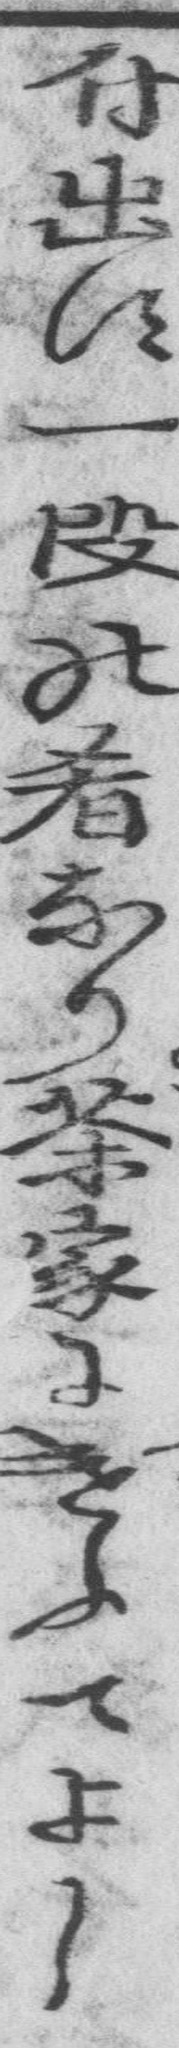付出す。一段の肴なり。茶家に遣ふてよし
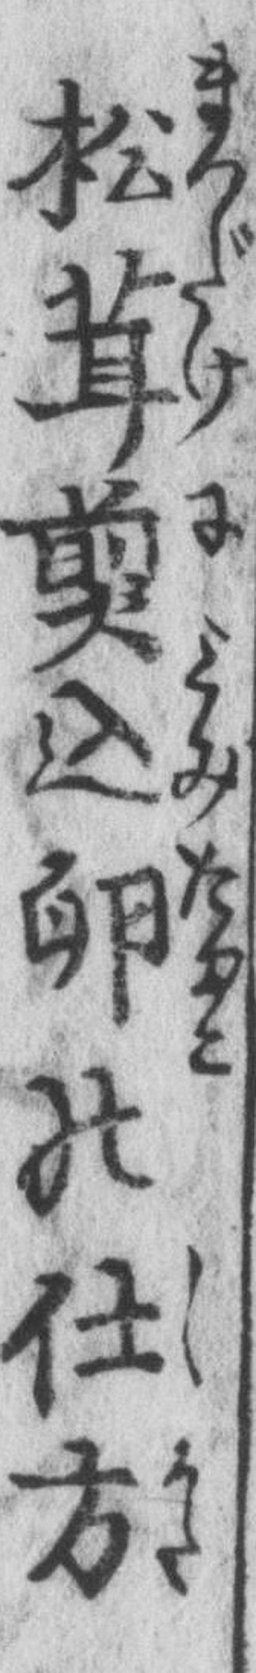松茸煎込卵の仕方
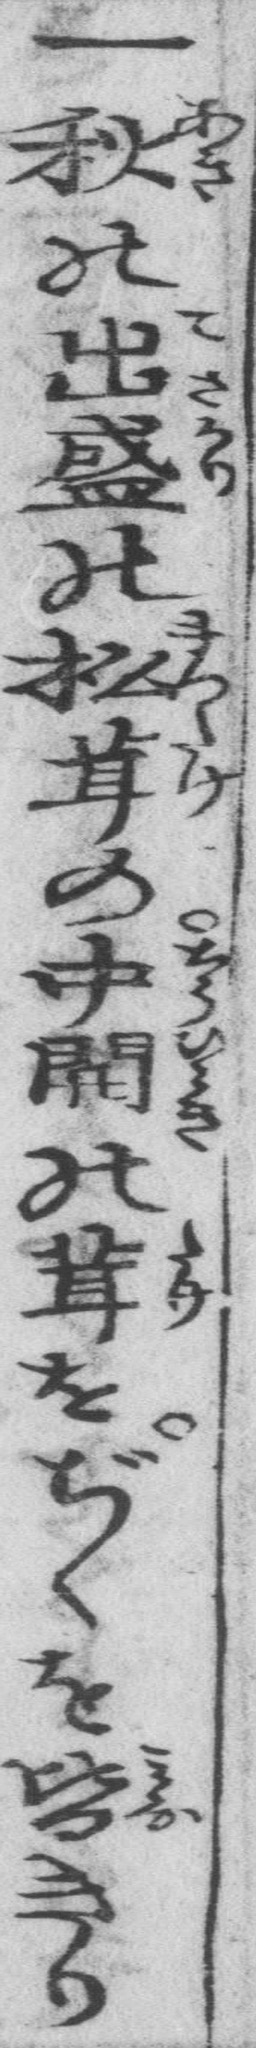一秋の出盛の松茸の。中開の茸を。ぢくを皆きり
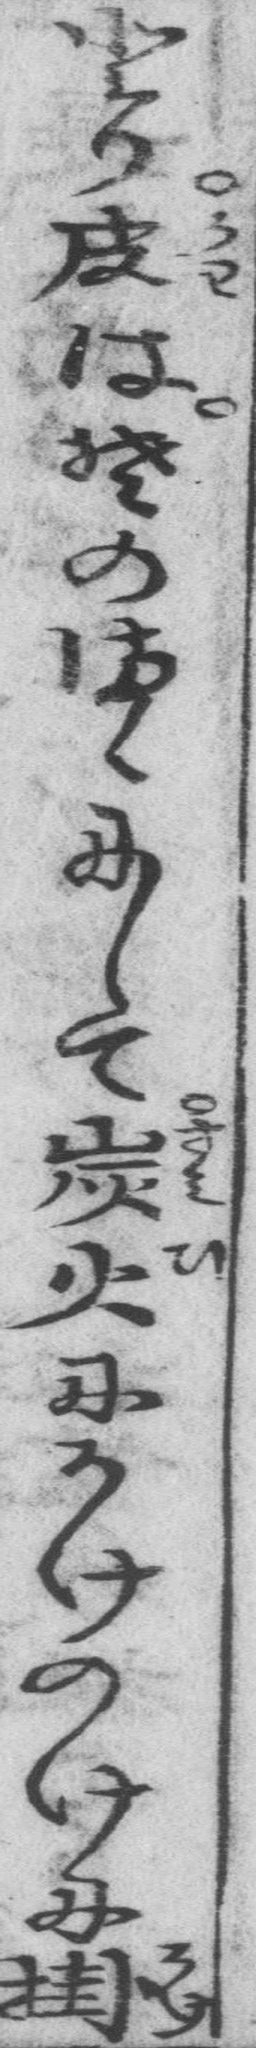とり。皮は。そのまゝにして。炭火にかけのけに掛
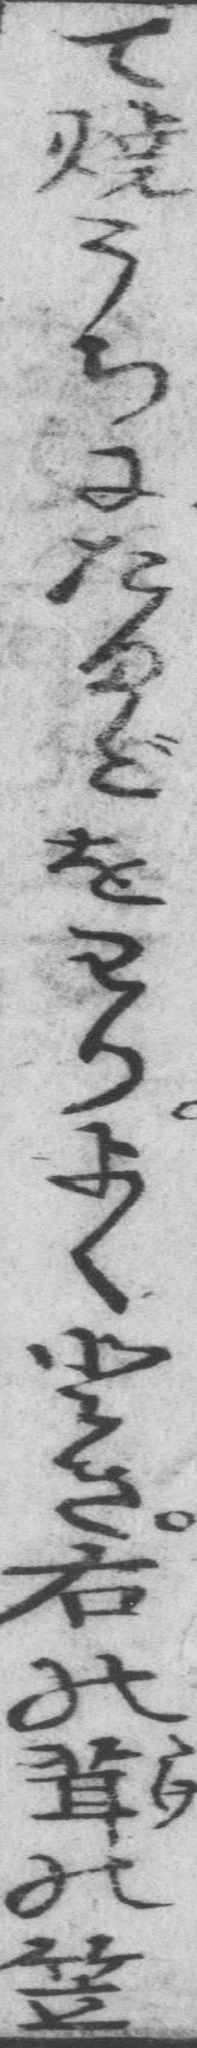て。焼うちに。たまごをわり。よくとき。右の茸の笠
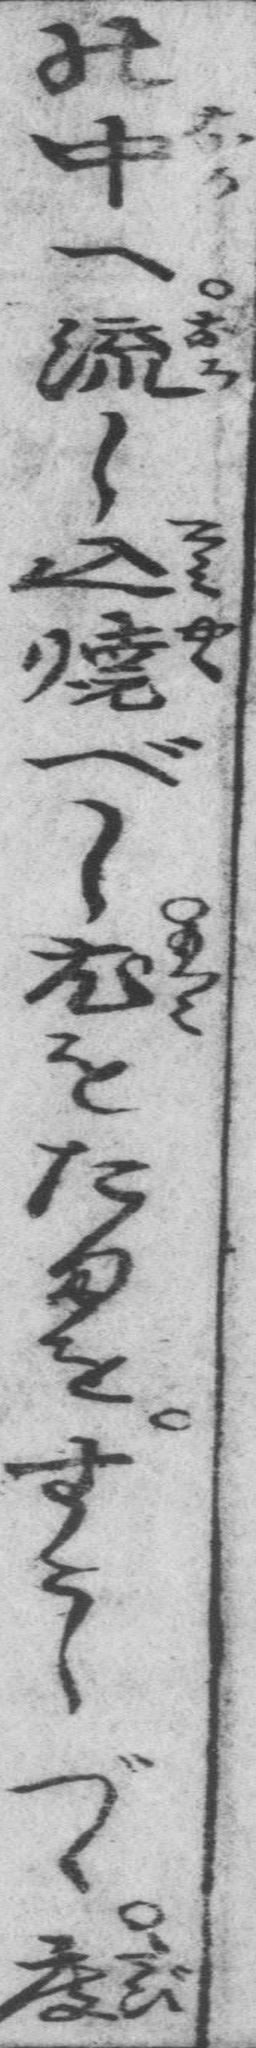の中へ。流し込焼べし、尤もたまを。すこしづゝ。度
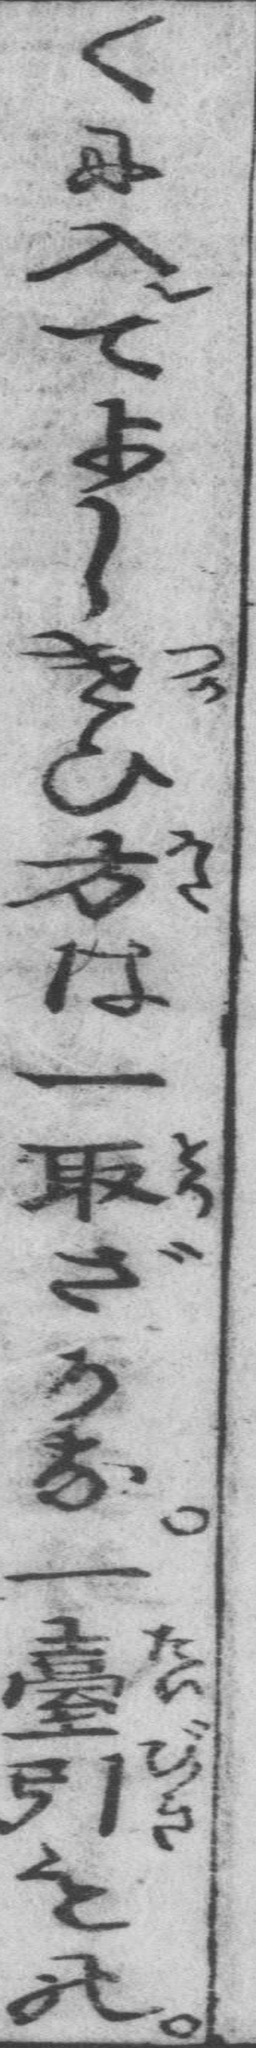〳〵に入れてよし遣ひ方は一取ざかな。一台引もの。

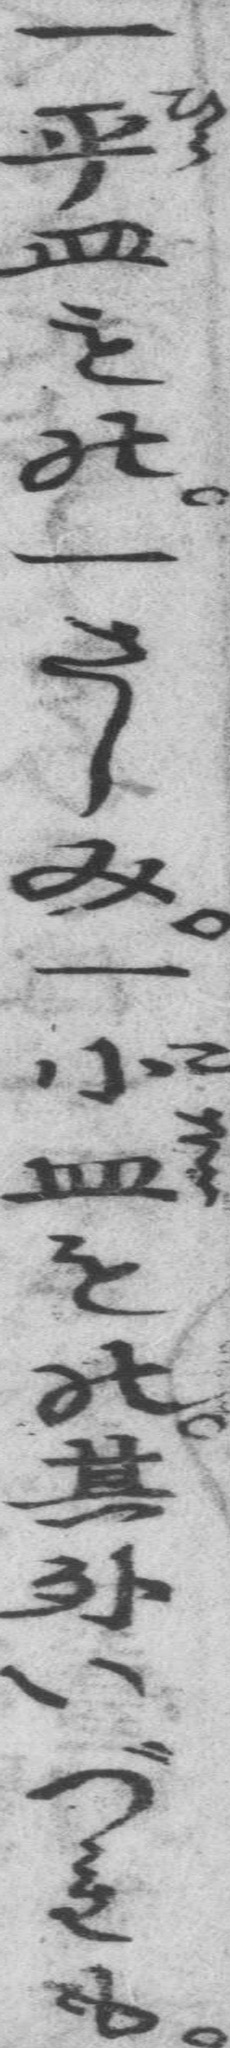一平皿もの。一さしみ。一小皿もの。其外いづれも。
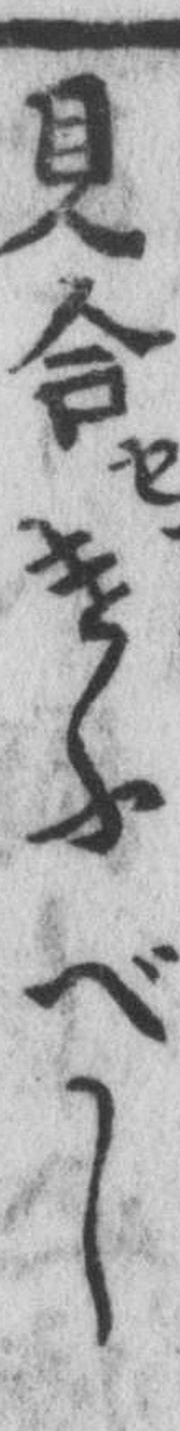見合せ遣ふべし
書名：萬寳料理秘密箱
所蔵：大阪府立大学学術情報センター 国文学研究資料館
